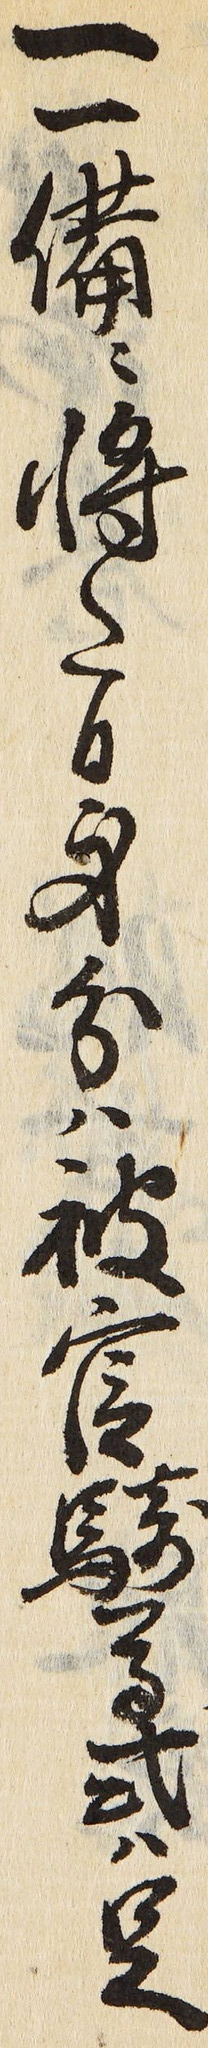一一備ニ得たる身分ハ被官騎馬式ハ足
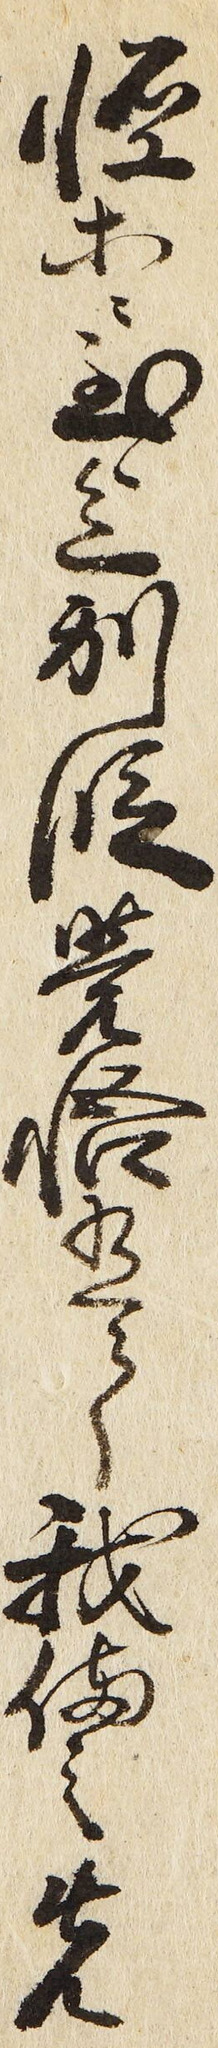軽等ニ至迄別段覚悟有之我備之先
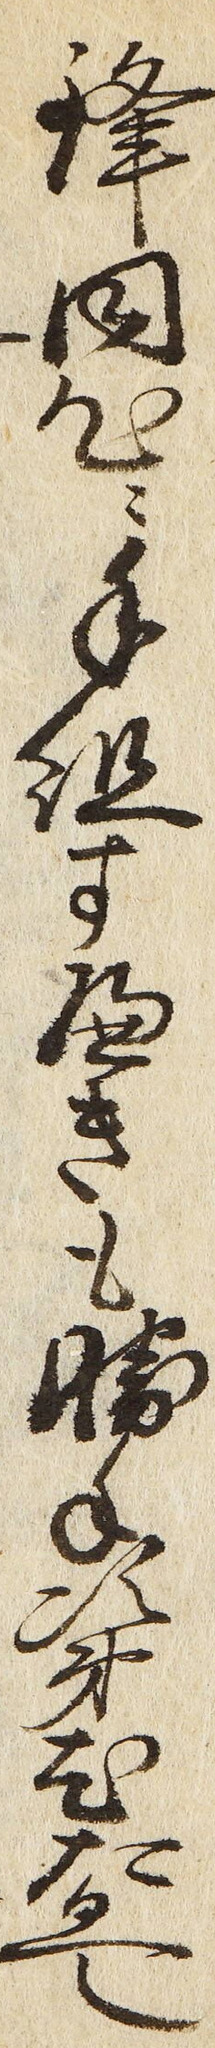鋒同心ニ手組すへきも勝手次第尤たるへし
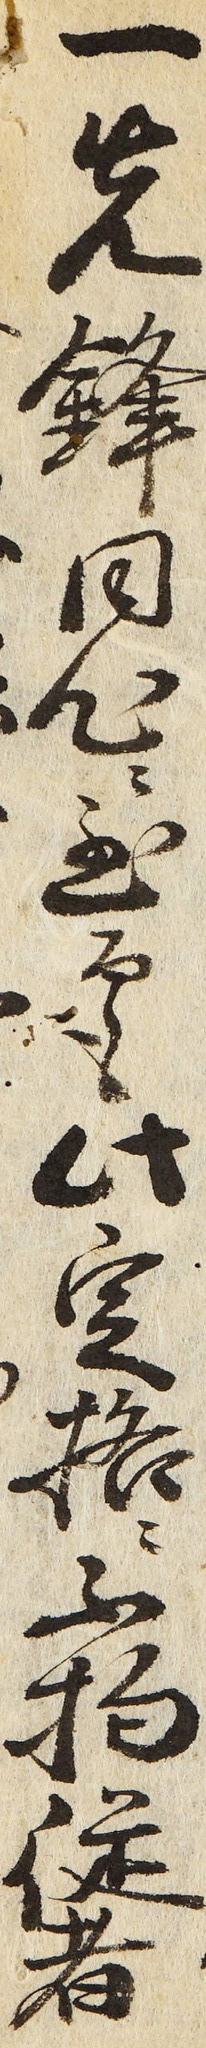一先鋒同心ニ至而も此定格ニ不拘従者
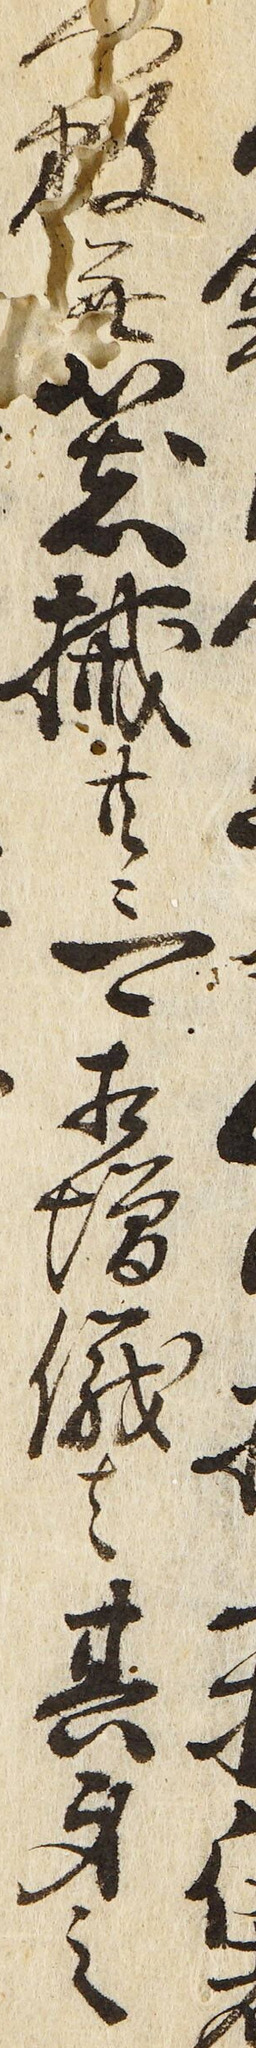人数并器械共ニ可相増儀者其身之
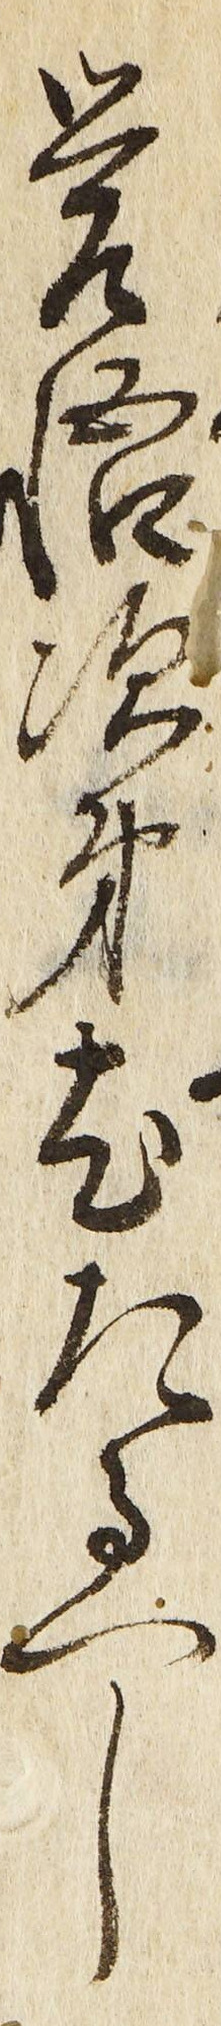覚悟次第尤たるへし
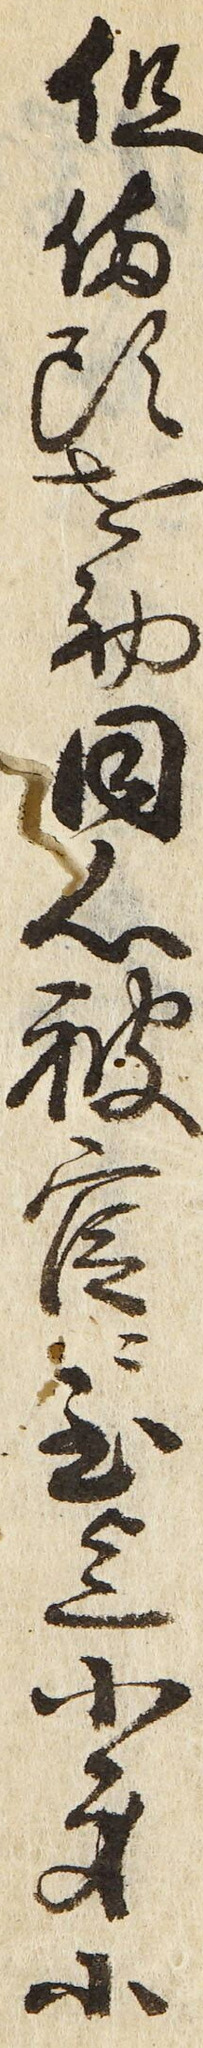但備頭を初同心被官ニ至迄小身に
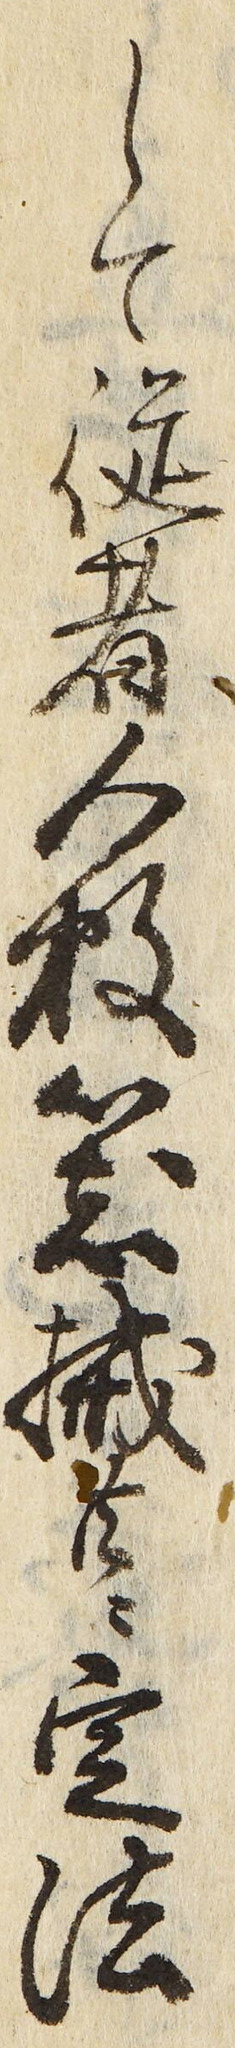して従者人数器械共ニ定法

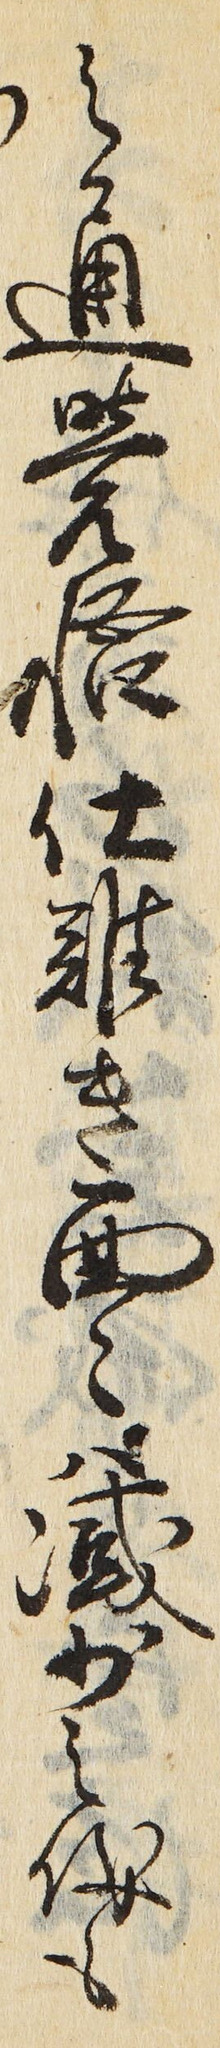之通覚悟仕難き面々ハ減少之儀も
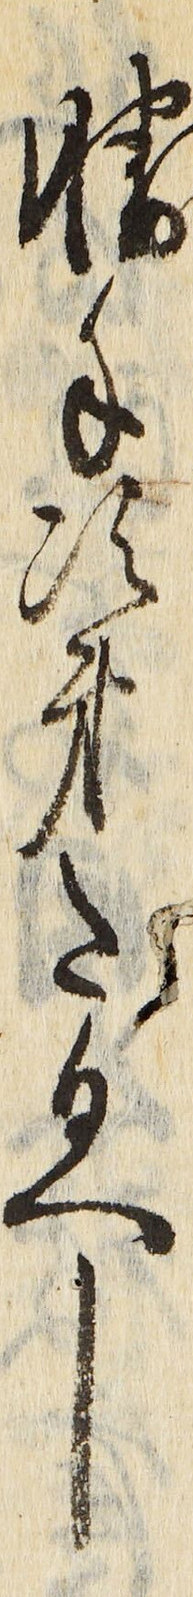勝手次第たるへし
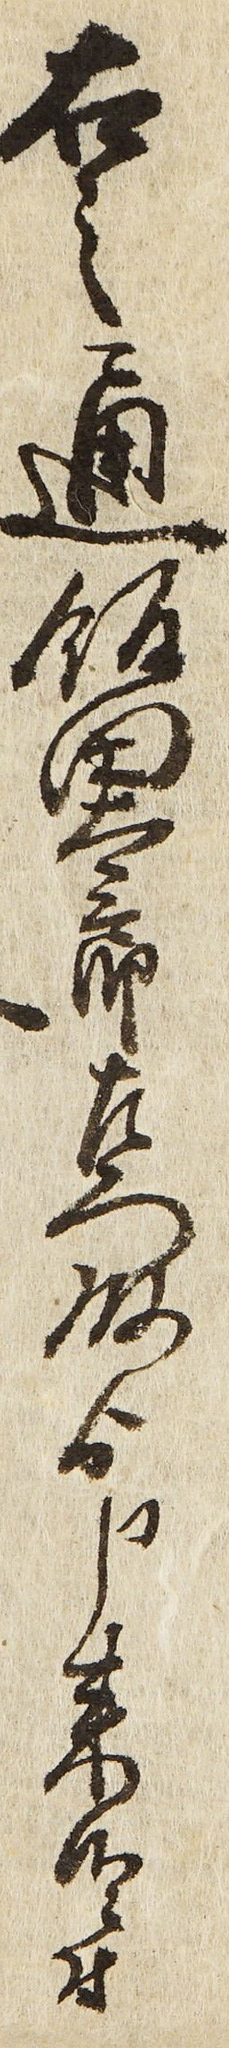右之通飯田太三郎左衛門殿ゟ申来候ニ付
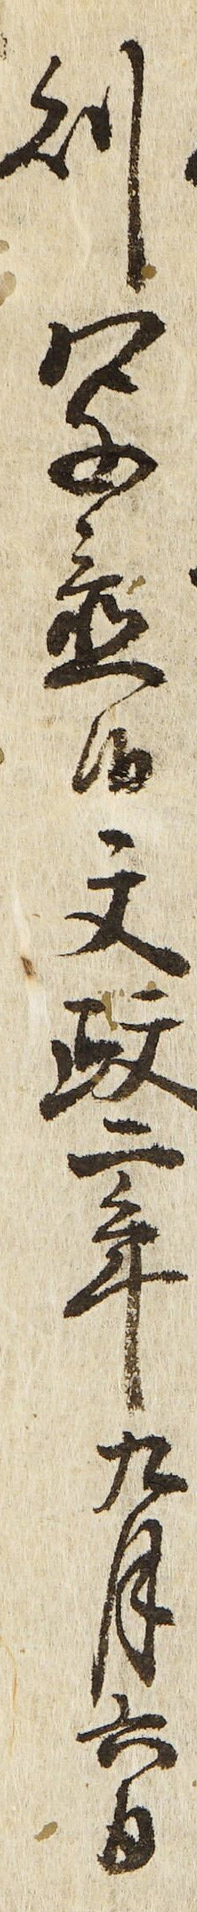則写置候文政二年九月六日
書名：御領海江異国船漂流有之節御手当之次第大組頭心得之廉々書集記
